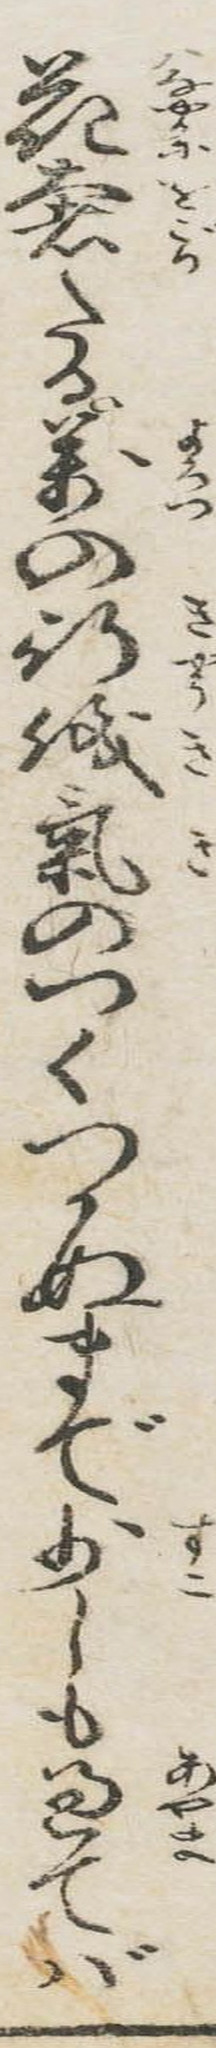花奢たる。万の行儀気のつくつかぬまで少しも過てば
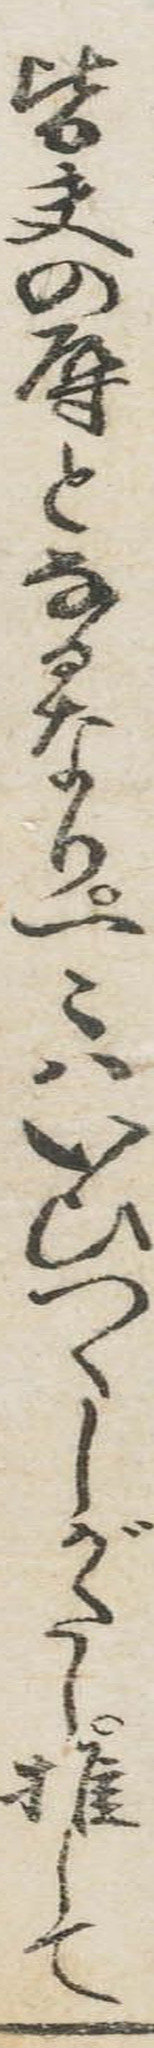皆夫の辱となるなり。一々はいひつくしがたし。推して
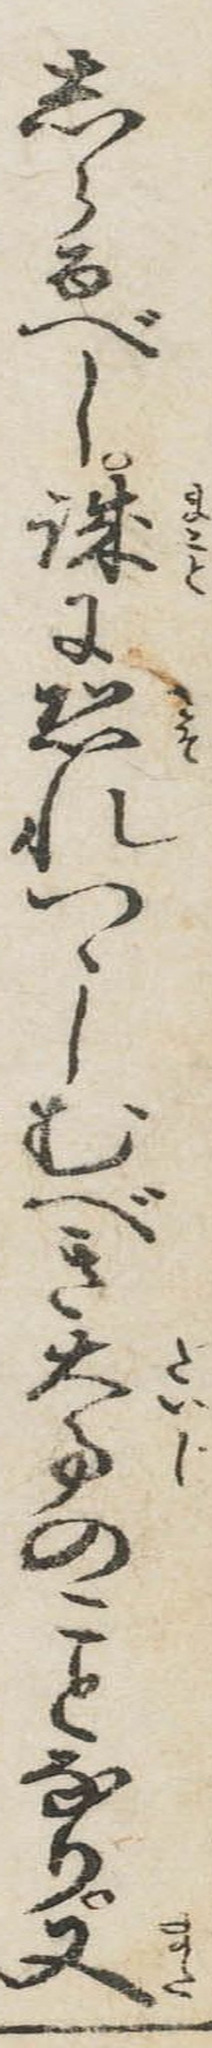しらるべし。誠に恐れつゝしむべき大事のことなり。又
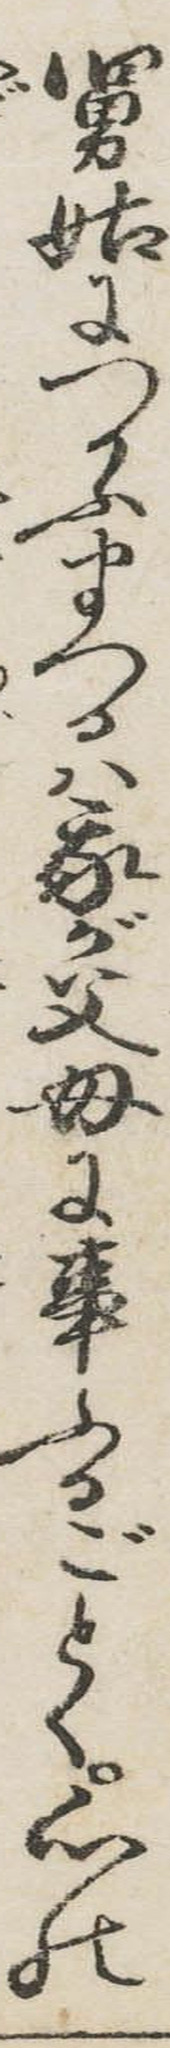舅姑につかふまつるは我が父母に事ふるごとく。心の
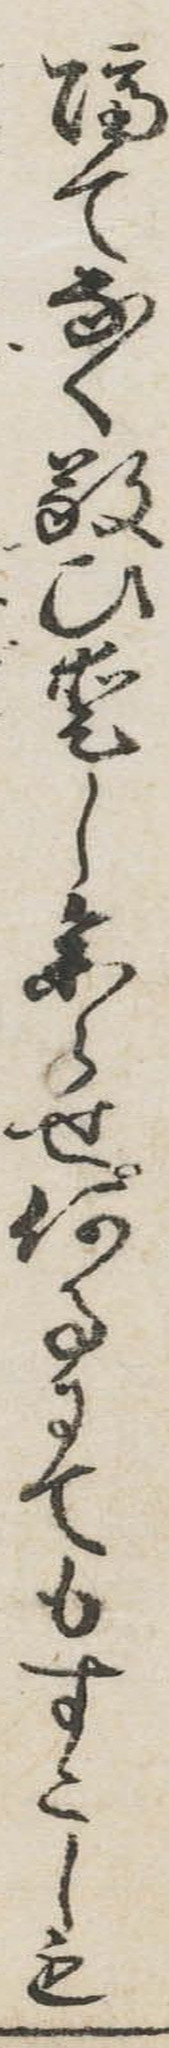隔てなく敬ひ愛し参らせ。何事にてもすこしも
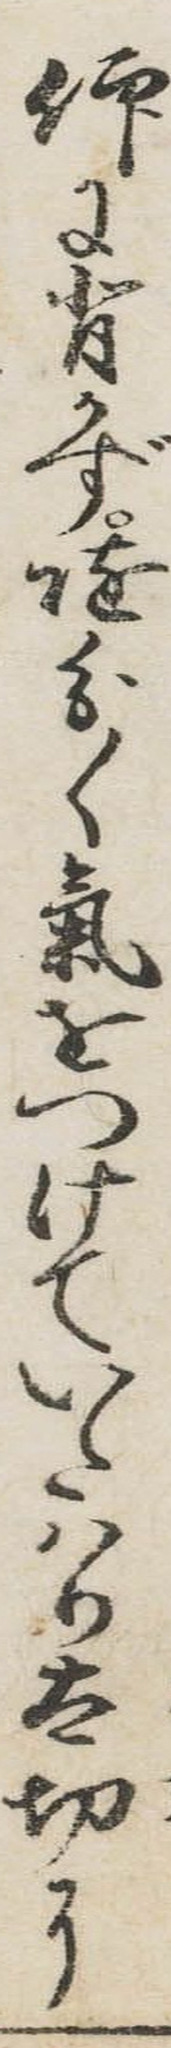仰に背かず。随分〳〵気をつけていたはり太切に
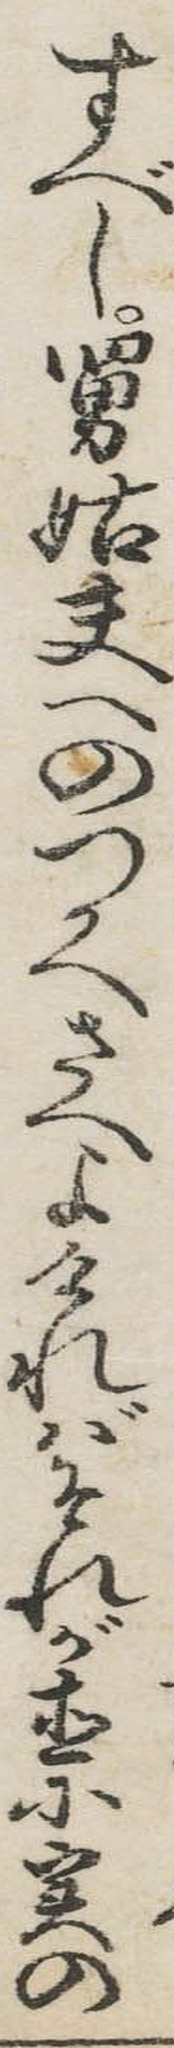すべし。舅姑夫へのつかへさへよければそれが直に実の
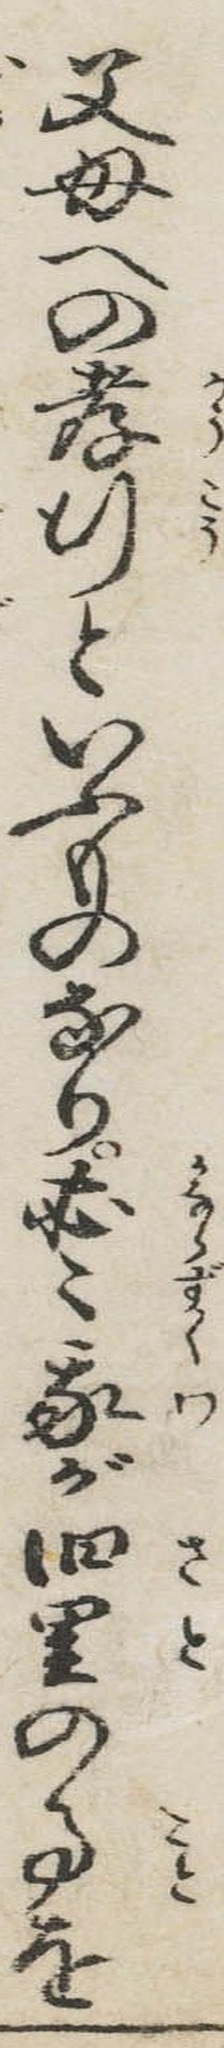父母への孝行といふものなり。必々我が旧里の事を
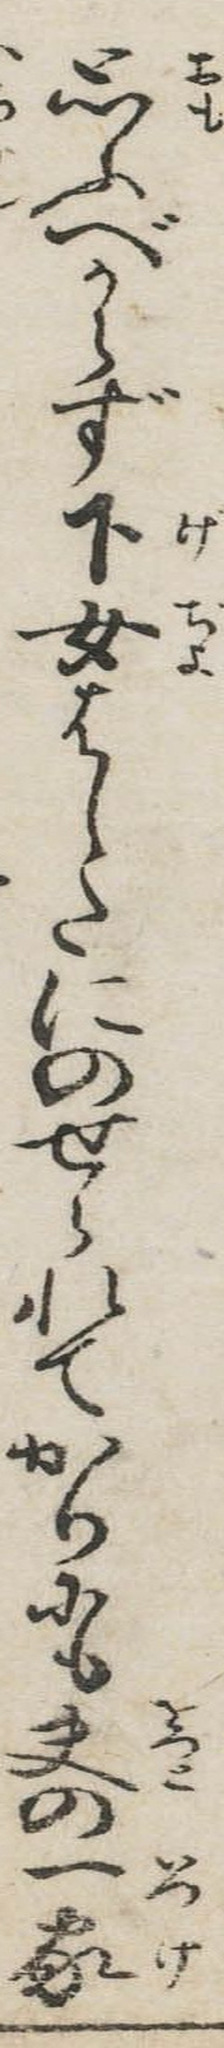思ふべからず下女はしたにのせられてかりにも夫の一家
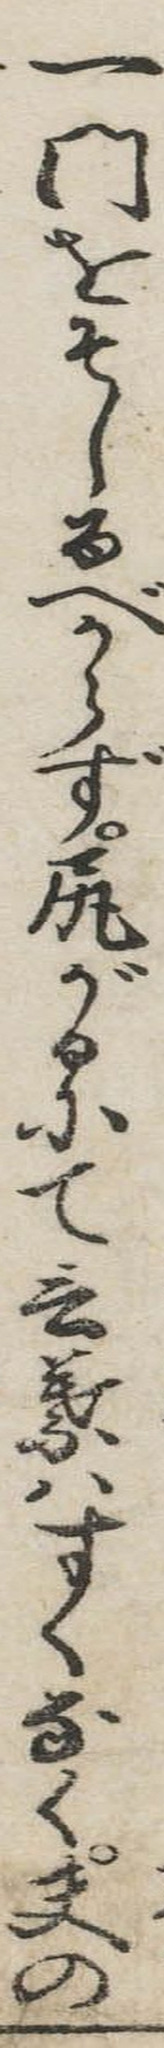一門をそしるべからず。尻がるにて言葉はすくなく。夫の
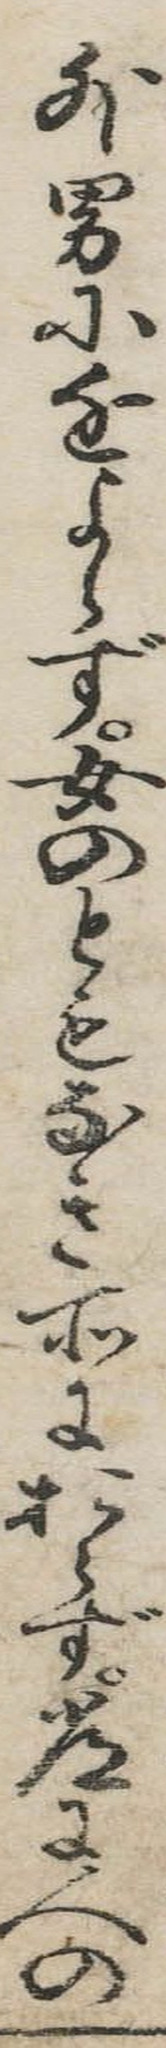外男に近よらず。女のともなき所におらず。常に人の
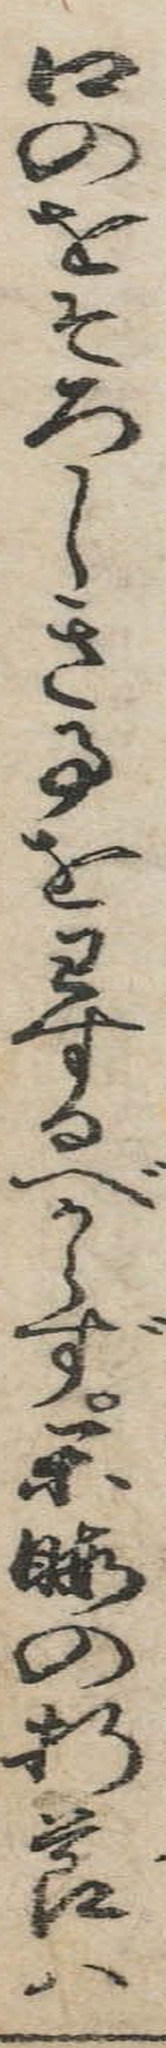口のをそろしき事をわするべからず。余暇の折節は

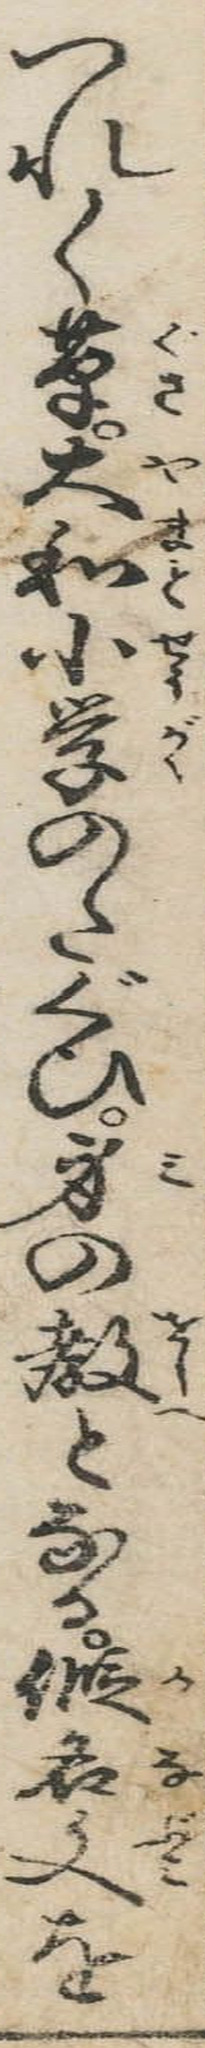つれ〳〵草。大和小学のたぐひ。身の教となる。假名文を
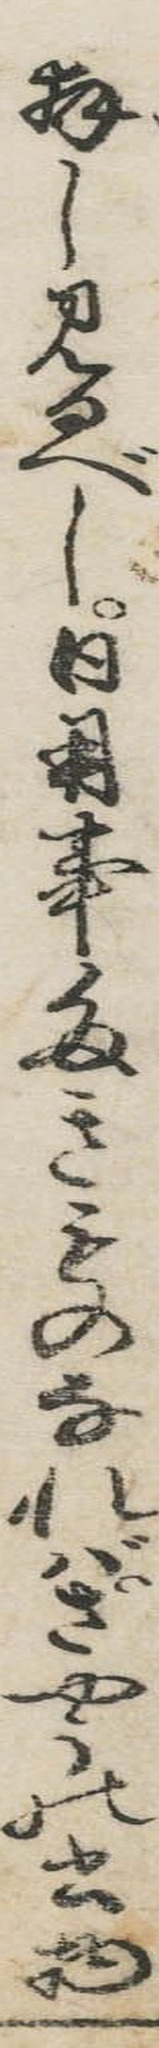拝し見るべし。日用事多きものなれば。さやうの書物
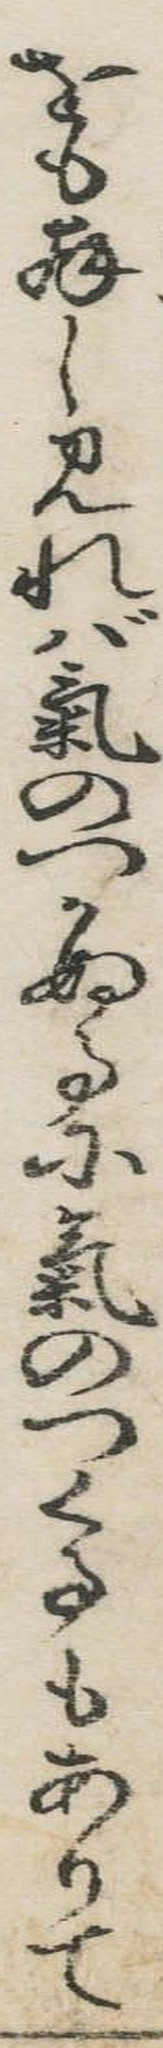をも拝し見れば気のつかぬ事に気のつく事もありて
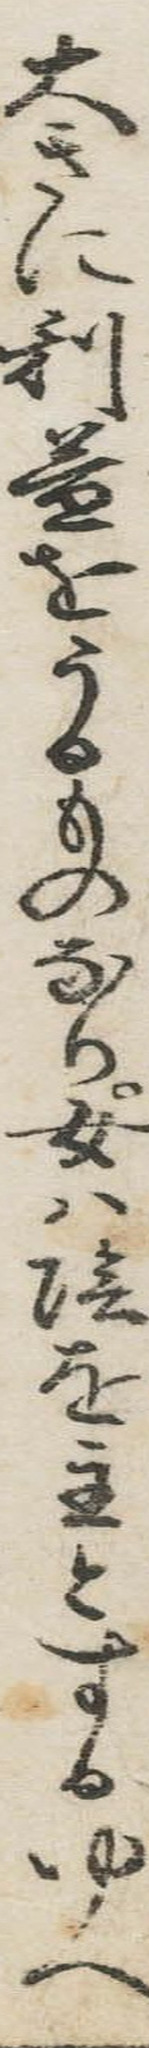大きに利益をうるものなり。女は陰を主とするゆへ
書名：前訓
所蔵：東京学芸大学附属図書館
